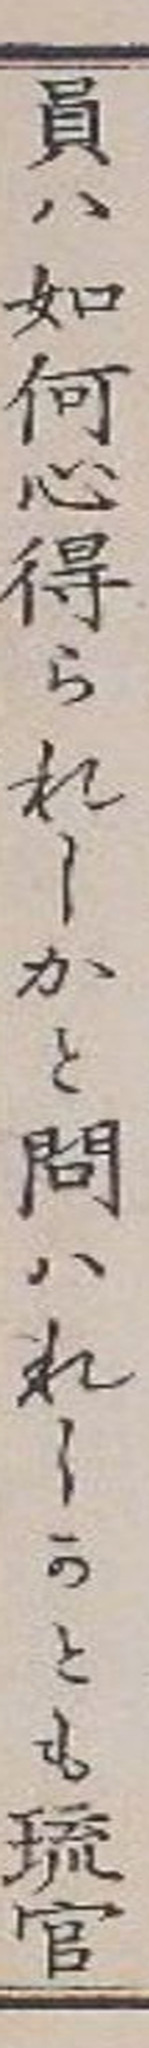員は如何心得られしかと問はれしかとも琉官

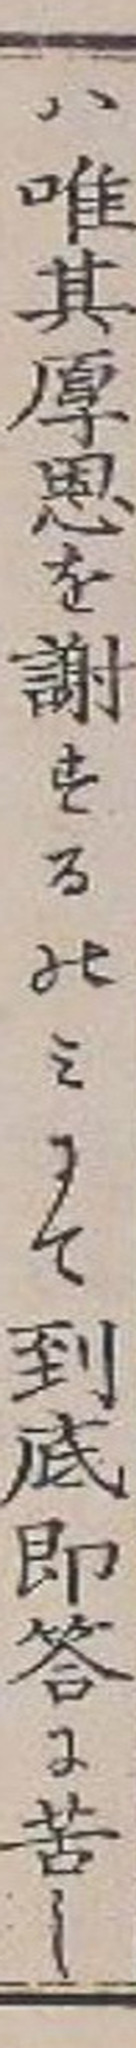は唯其厚恩を謝するのみにて到底即答に苦し
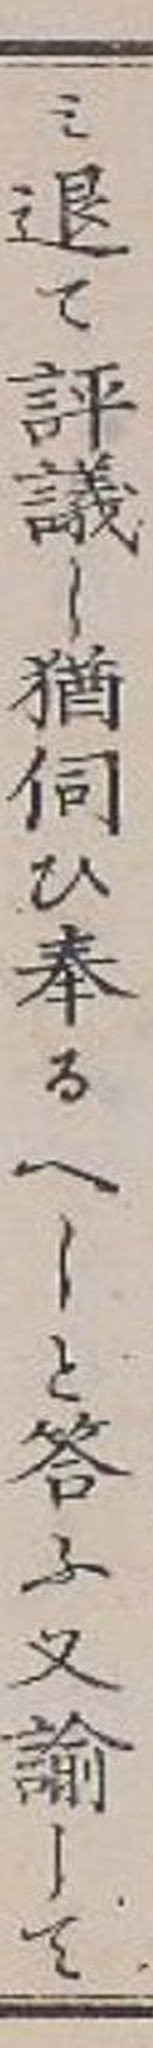み退て評議し尚伺ひ奉るへしと答ふ又諭して
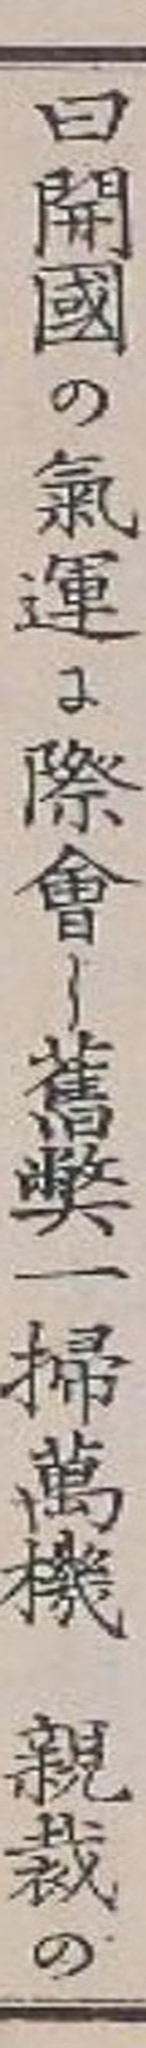曰開国の機運に際会し旧弊一掃万機親裁の
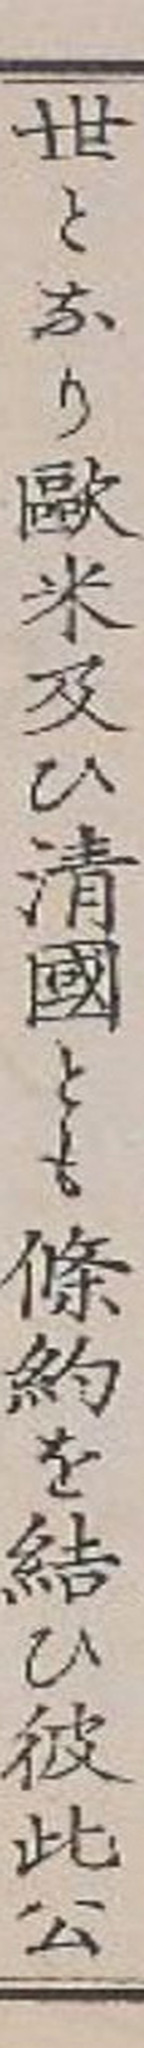世となり欧米及ひ清国とも条約を結ひ彼此公
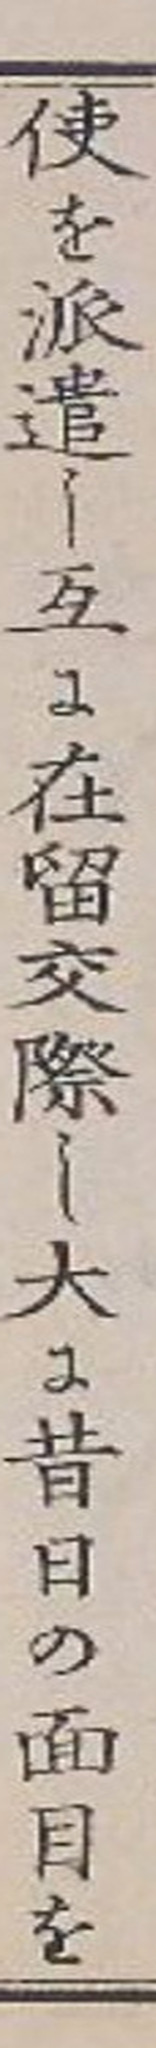使を派遣し互に在留交際し大に昔日の面目を
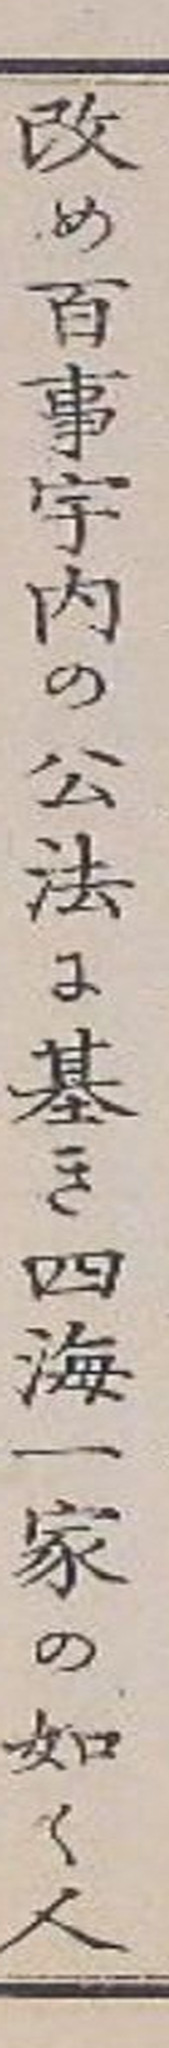改め百事宇内の公法に基き四海一家の如く人
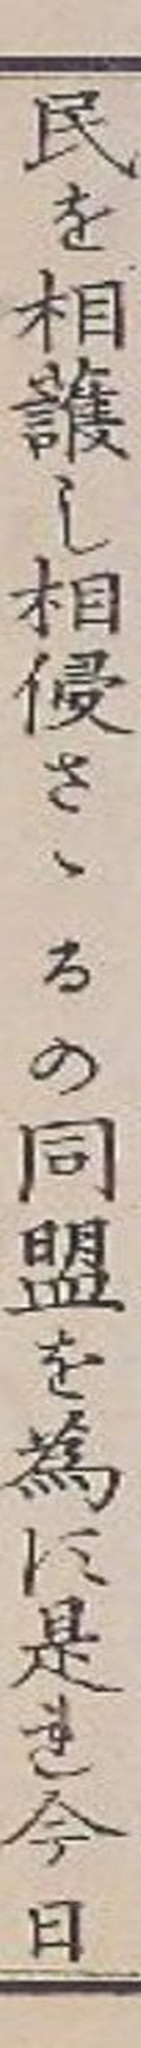民を相護し相侵さゝるの同盟を為す是れ今日
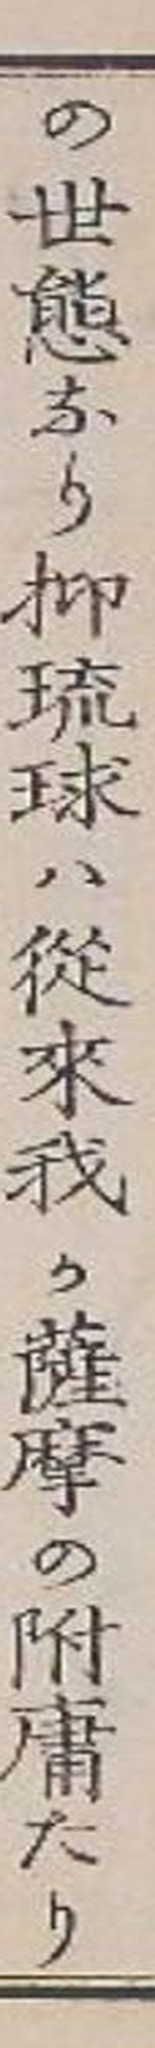の世態なり抑琉球は従来我か薩摩の付庸たり
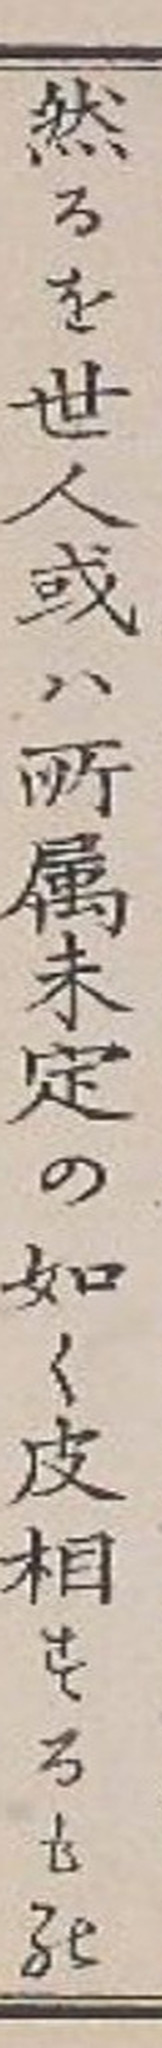然るを世人或は所属未定の如く皮相するもの
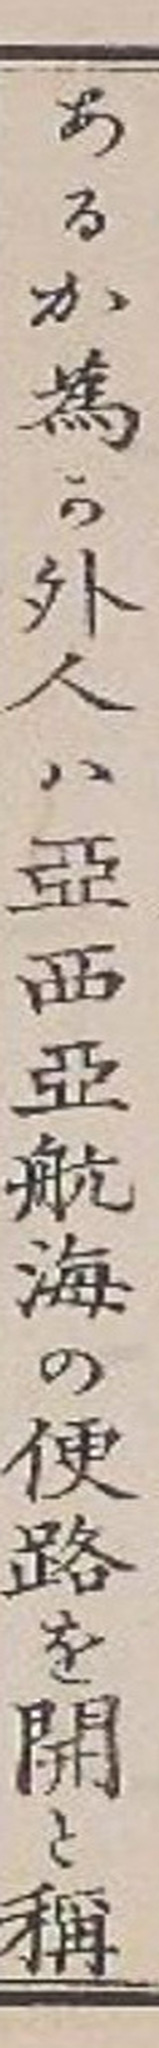あるか為か外人は亜細亜航海の便路を開と称
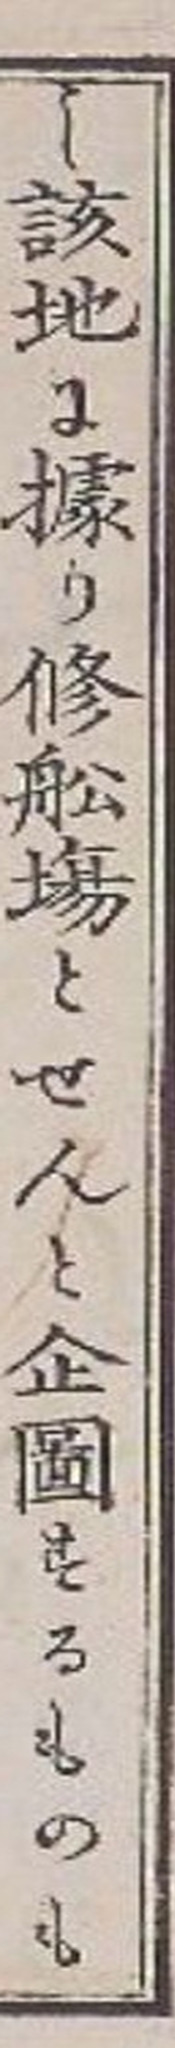し該地に拠り修航場とせんと企図するものも
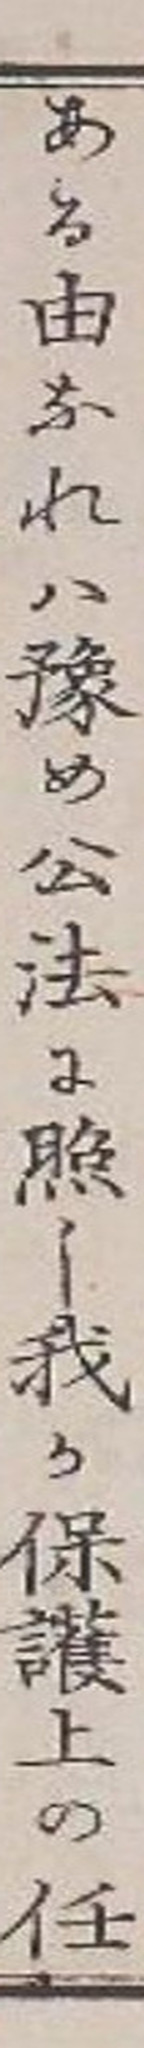ある由なれは予め公法に照し我か保護上の任
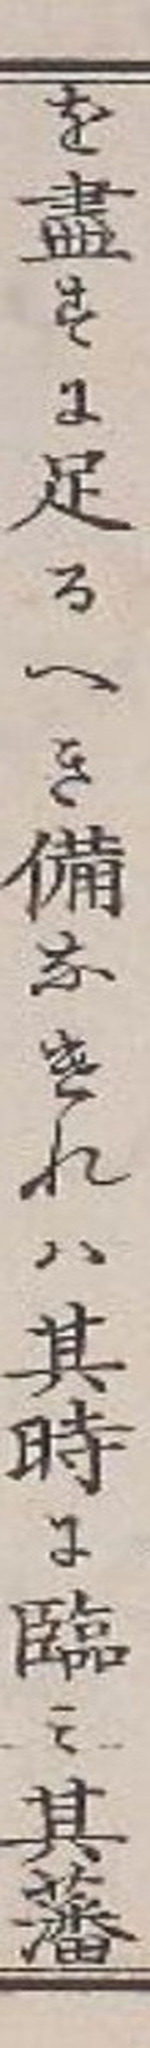を尽すに足るへき備なけれは其時に臨み其藩
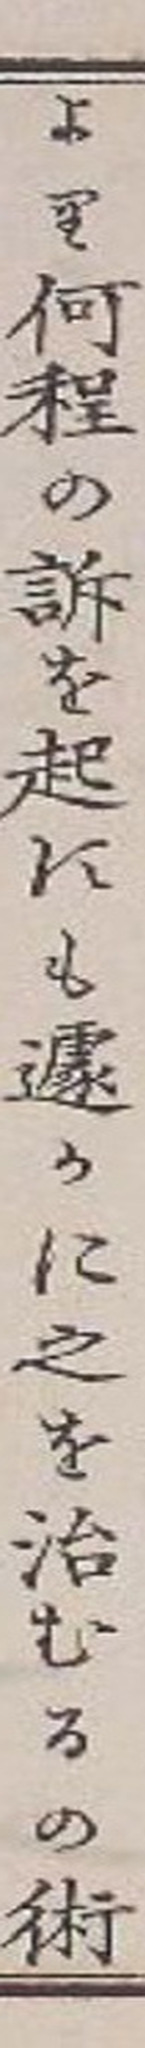より何程の訴を起すも遽かに之を治むるの術
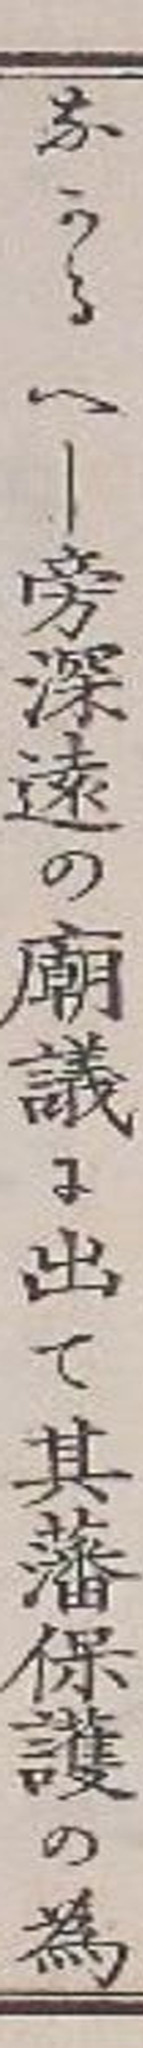なかるへし旁深遠の廟議に出て其藩保護の為
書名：南島紀事 下
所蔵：University of the Ryukyus Library
